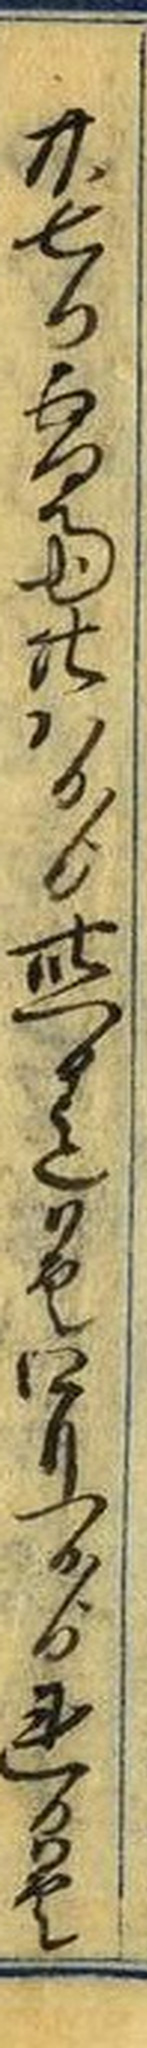廿七日雪雨廿八日ゟ丗一日迄曇四月一日ゟ連日曇

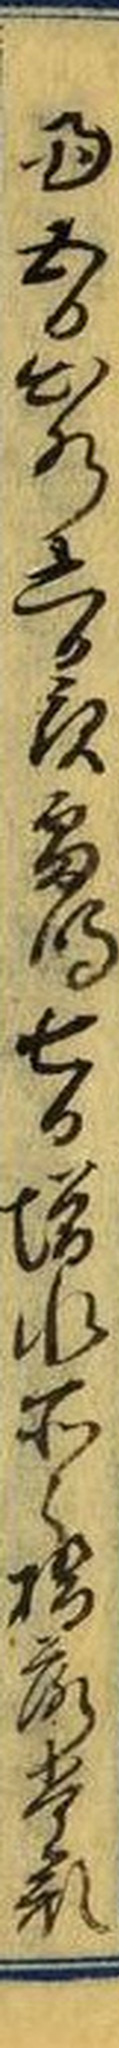雨五日出水六日夜雷鳴七日増水所々橋落堂形
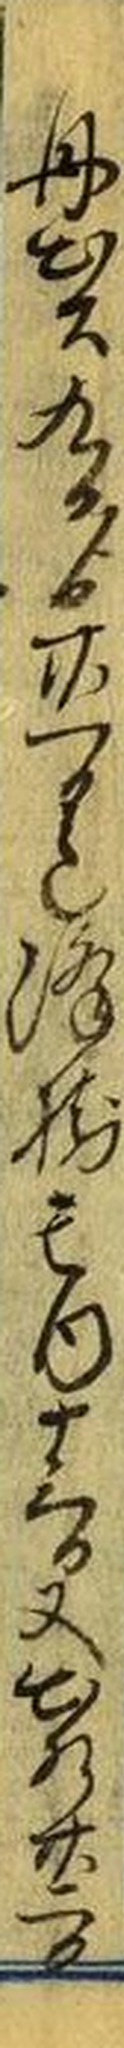舟出す九日ゟ廿一日迄降勝其内十三日又出水廿二日
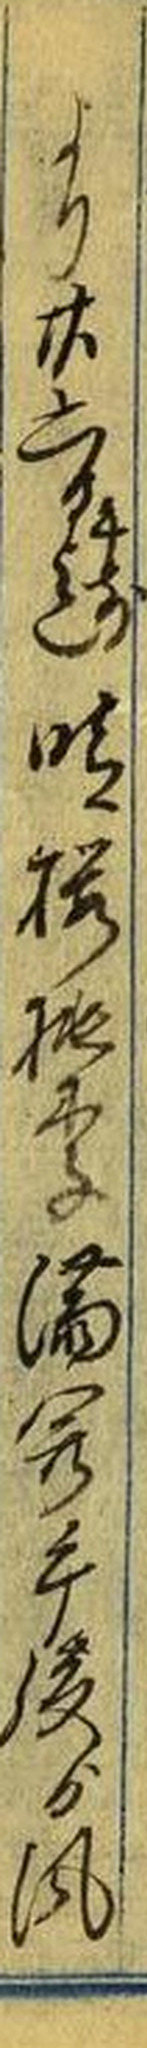より廿六日午前迄晴桜桃李満開午後ゟ風
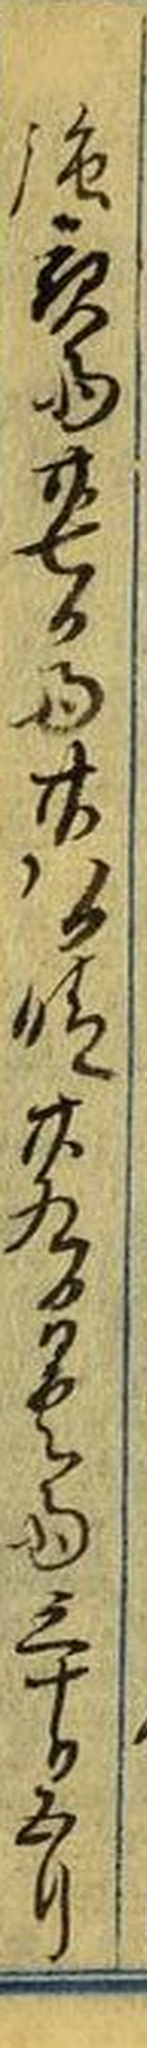強夜雨廿七日雨廿八日晴廿九日曇雨三十日五月
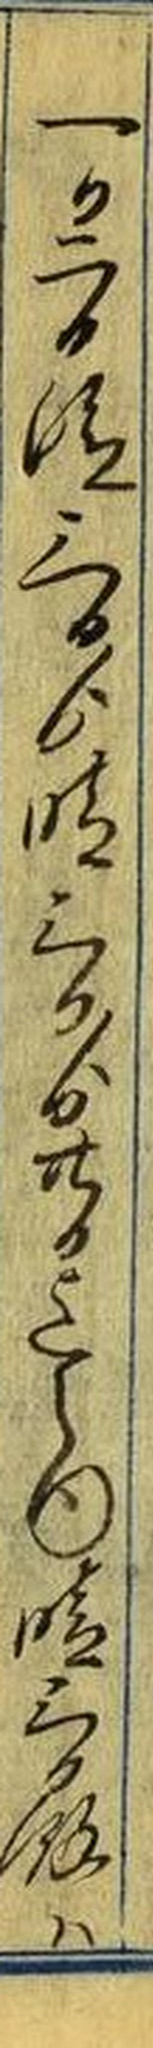一日二日晴三日ゟ晴三日ゟ廿日迄之内晴三日余は
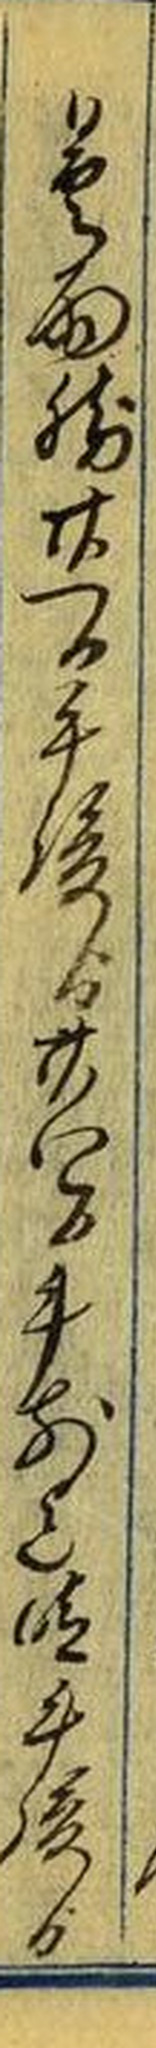曇雨勝廿一日午後ゟ廿四日午前迄晴午後ゟ
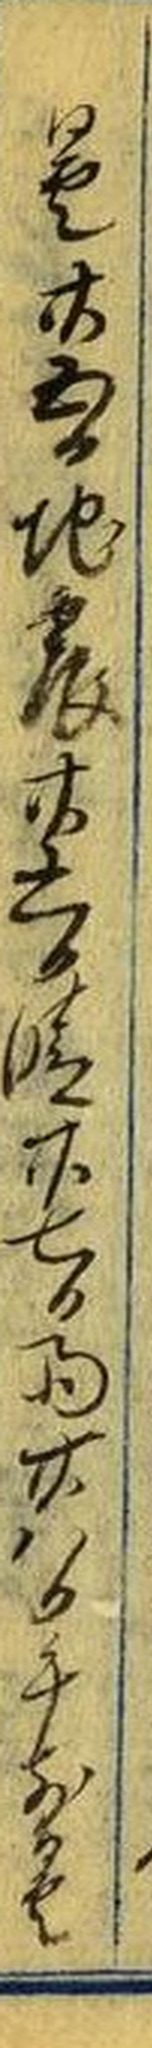曇廿五日地震廿六日晴廿七日雨廿八日午前曇
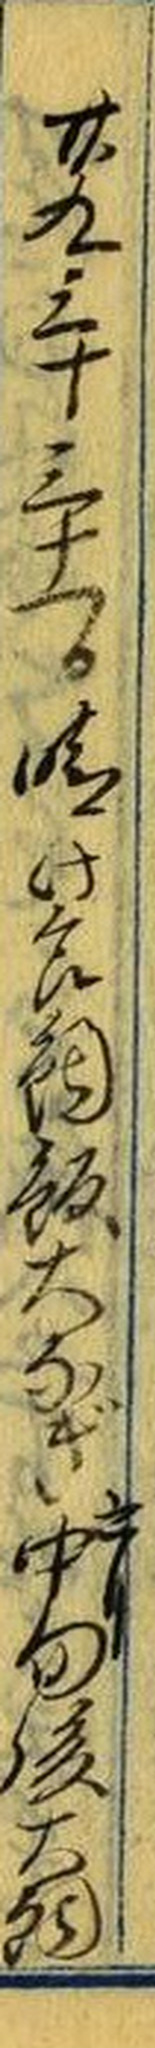廿九三十三十一日晴此節鯛魬大なぎ六月中旬後大鯛
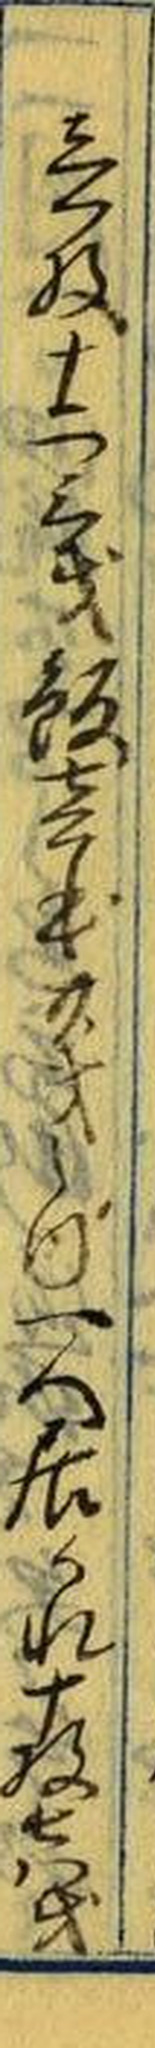壱枚十二三戔魬壱本廿戔之内一人居かれ十枚七八戔
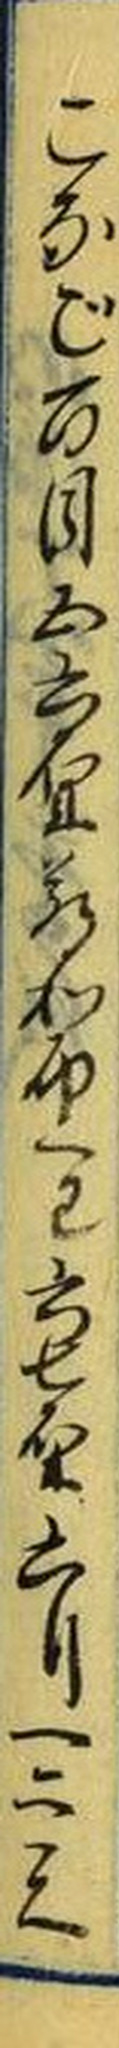こなご百目五六厘若和布一包六七厘六月一二三
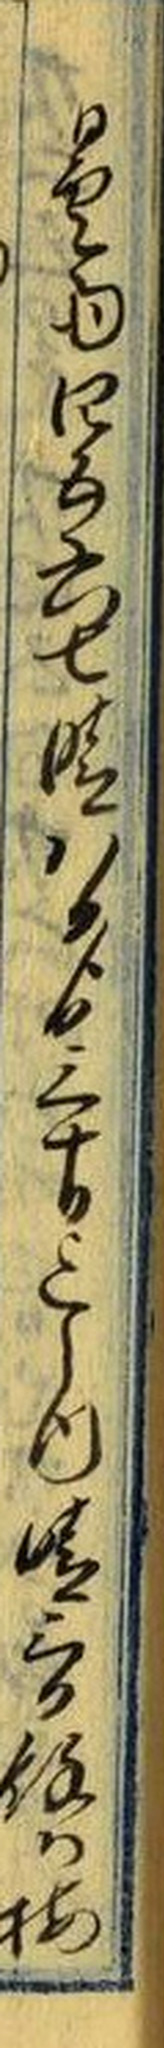曇雨四五六七晴八日ゟ三十日迄之内晴三日余は梅
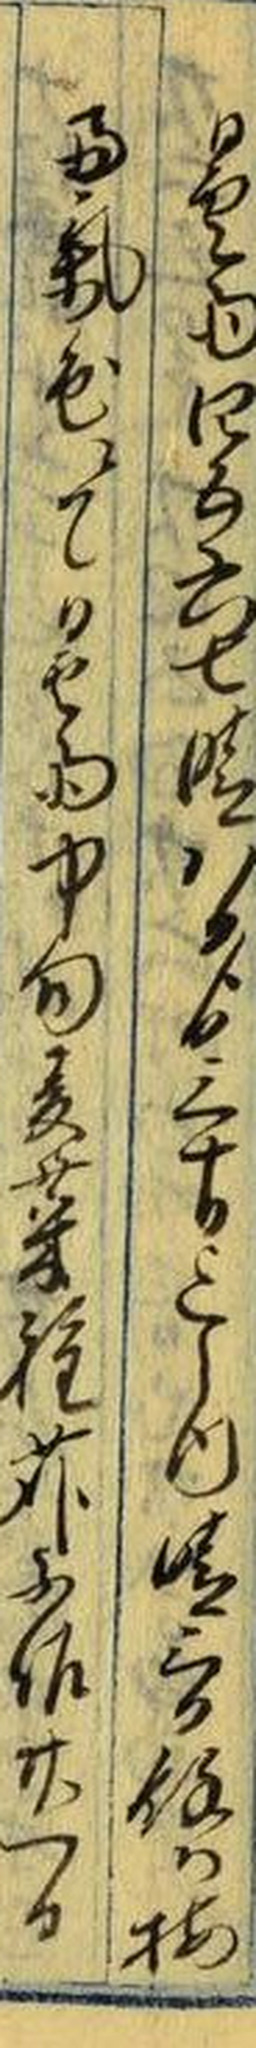雨気色にて曇雨中旬麦菜種苅不作廿一日
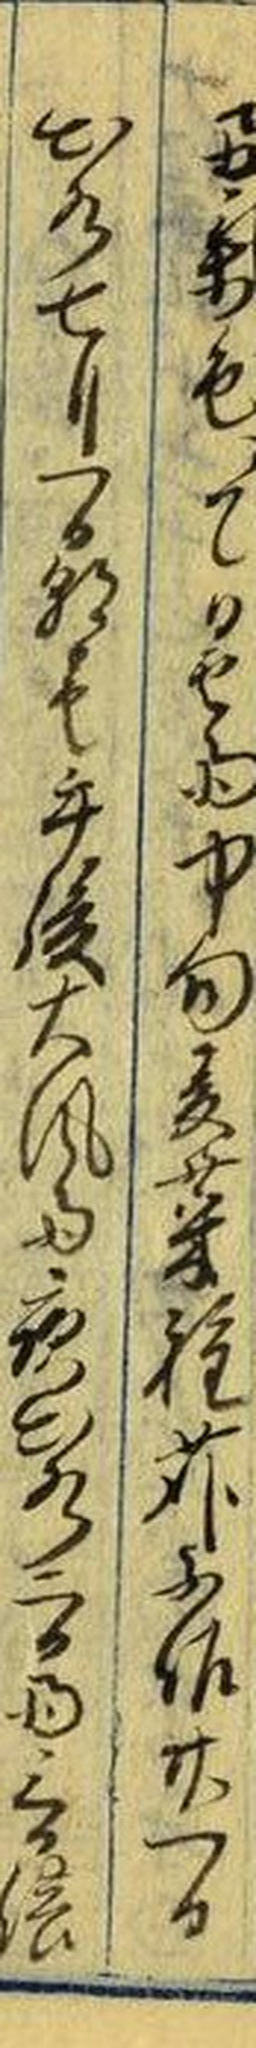出水七月一日朝曇午後大風雨夜出水二日雨三日催
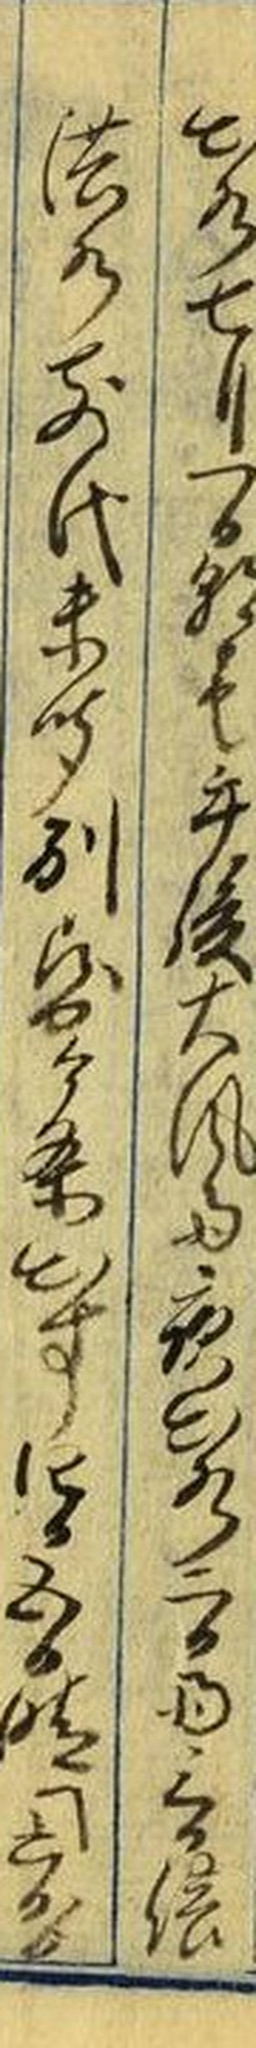洪水前代未聞別替ヶ条出す四日五日晴「六日ゟ
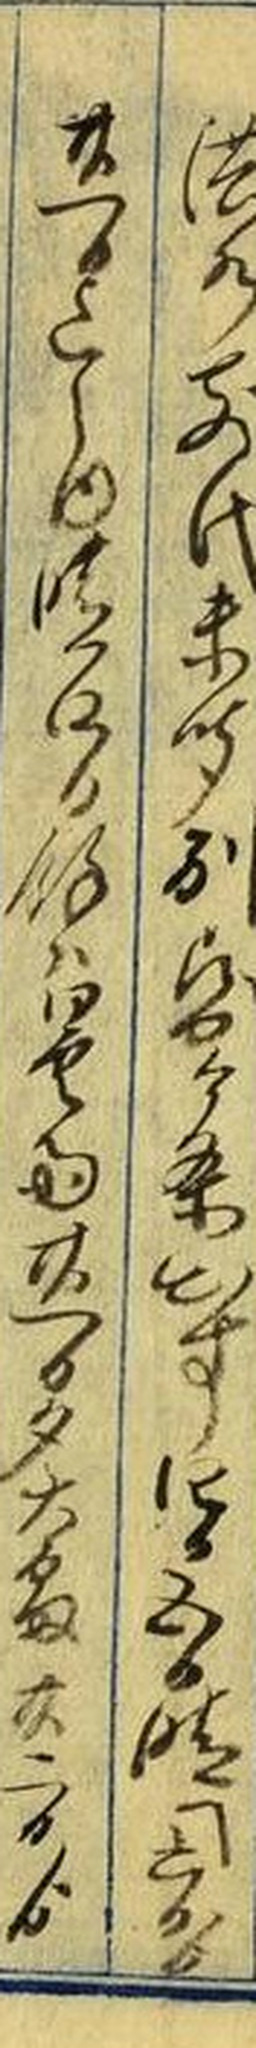廿一日迄之内晴四日余は曇雨廿一日夕大雷廿二日ゟ
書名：温古集 五巻
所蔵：福井県文書館 Fukui Prefectural Archives
